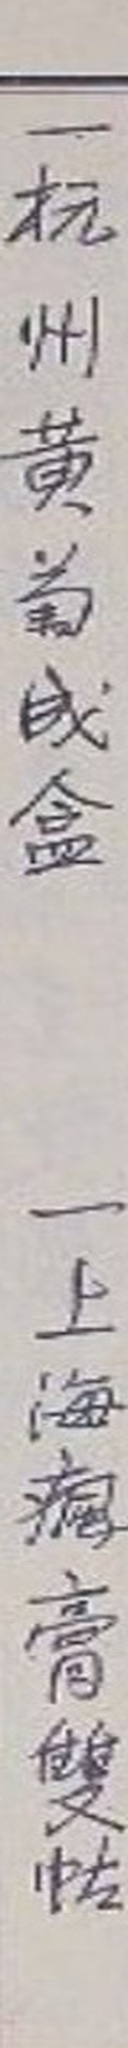一杭州黄菊成盒一上海瘋膏雙帖
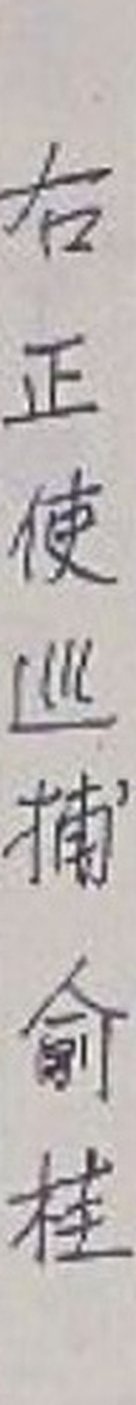右正使巡捕兪桂
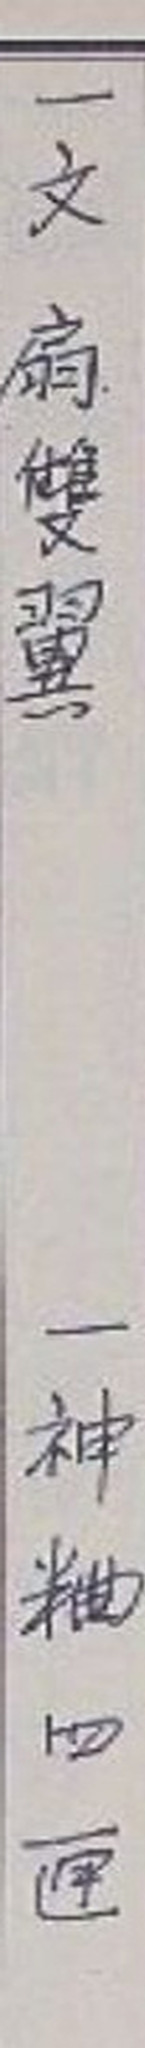一文扇雙翼一神粬四匣
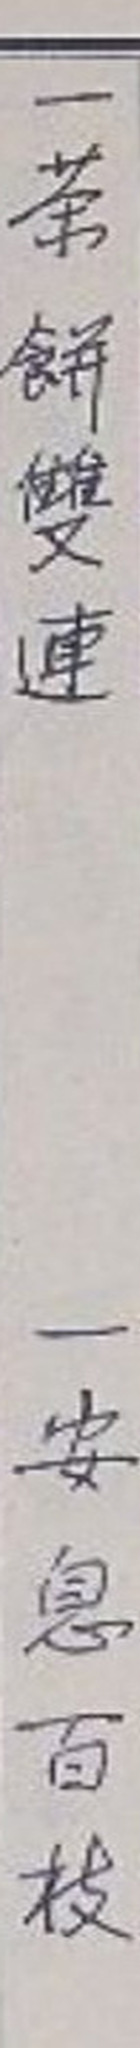一茶餅雙連一安息百枝
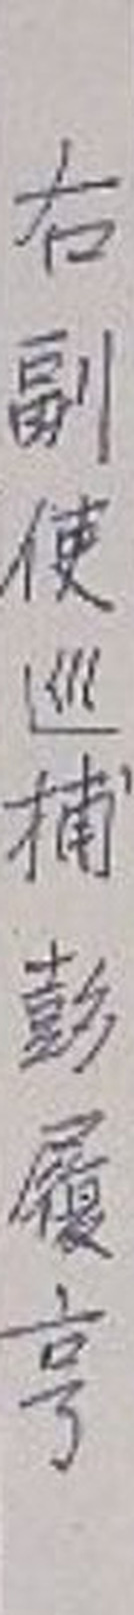右副使巡捕彭履亨
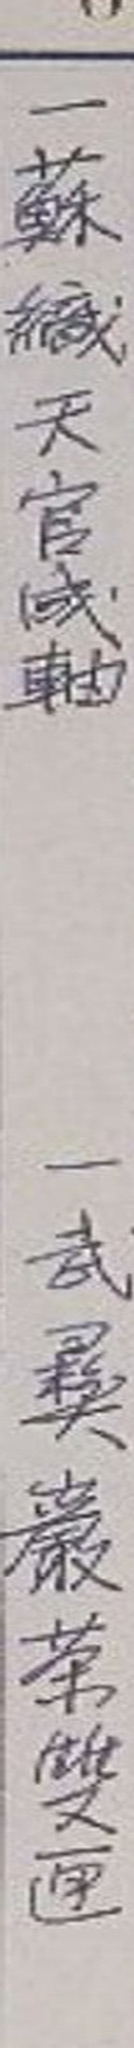一蘇織天官成軸一武彛巖茶雙匣
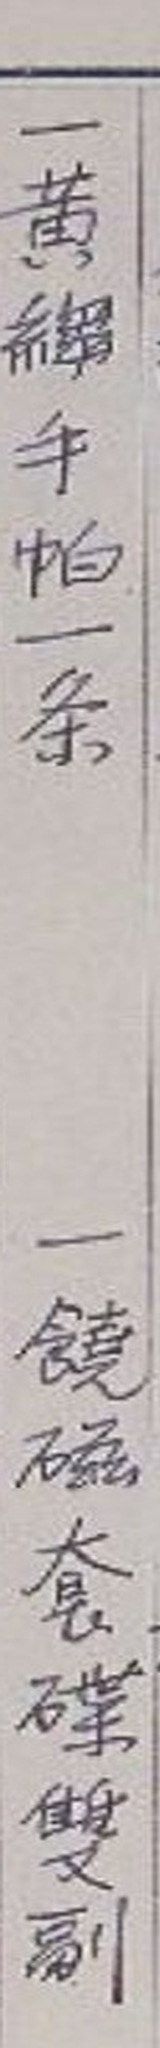一黄縐手帕一条一鏡磁套碟雙副
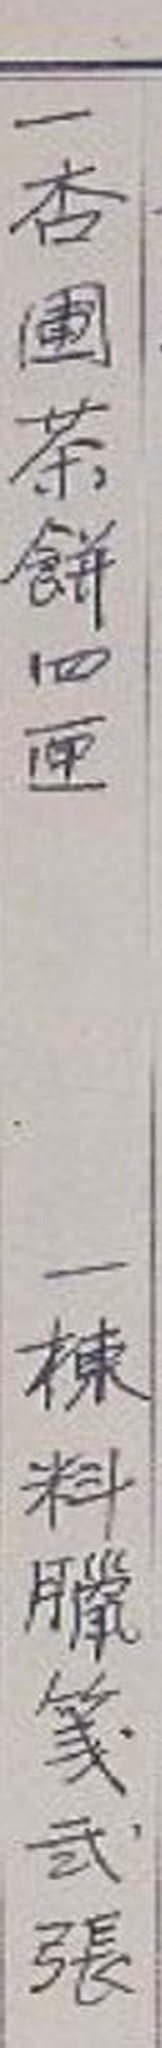一杏圃茶餅四匣一棟料臘箋弐張

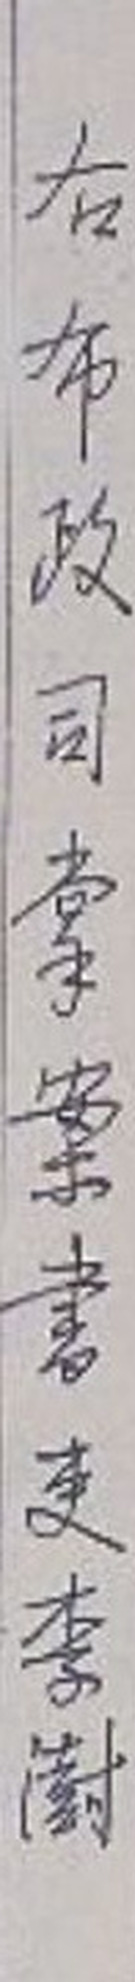右布政司掌案書吏李澍
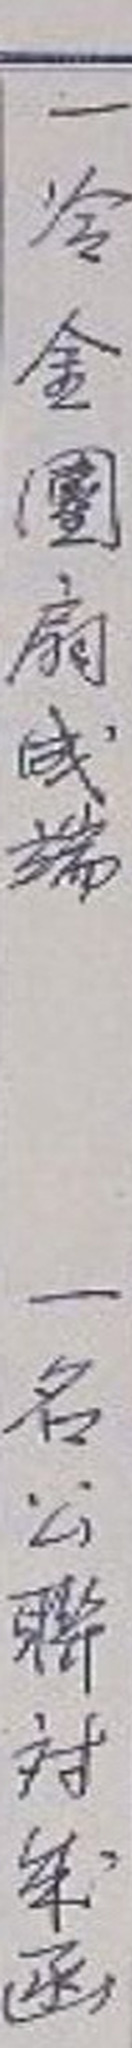一冷金団扇成端一名公聯対成函
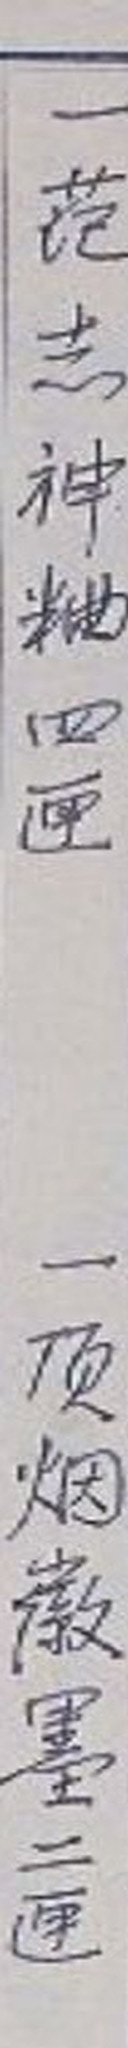一范志神粬四匣一頂烟徽墨二匣
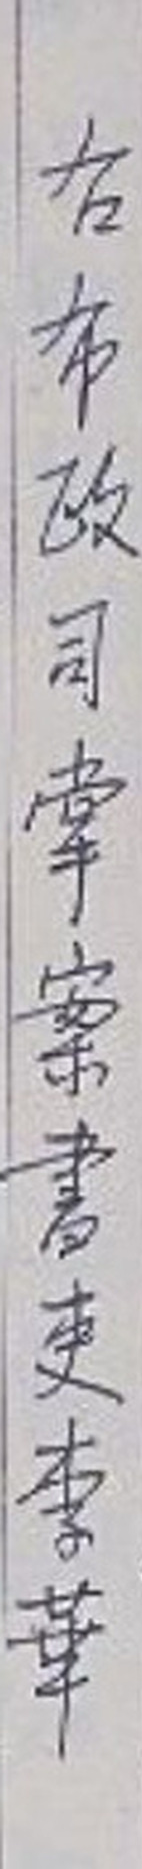右布政司掌案書吏李華
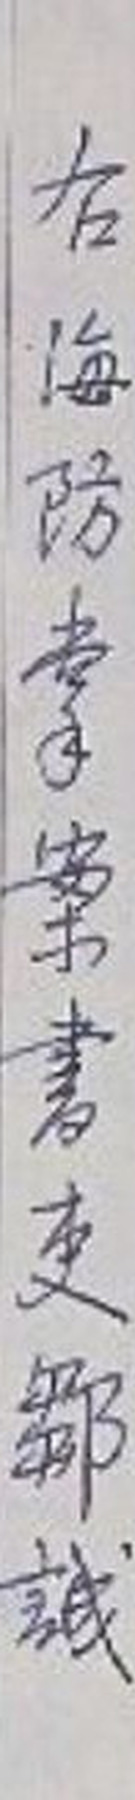右海防掌案書吏鄒誠
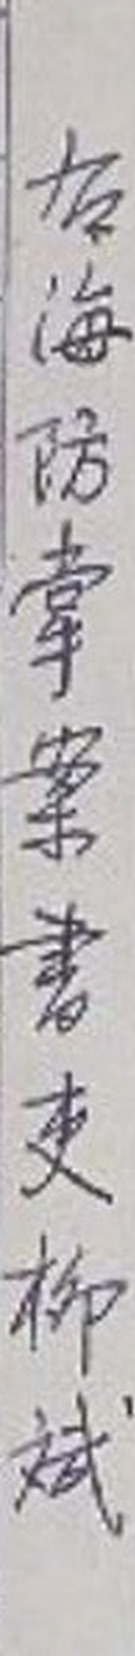右海防掌案書吏柳斌
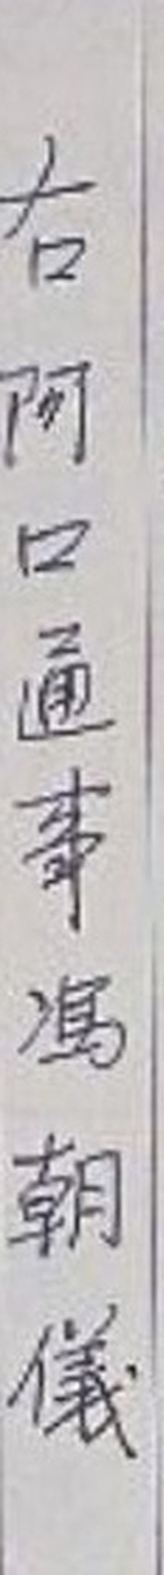右阿口通事馮朝儀
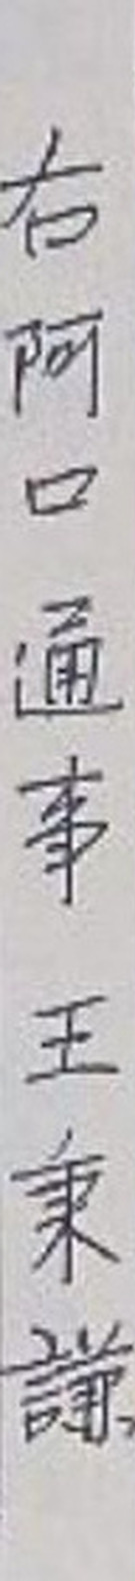右阿口通事王秉謙
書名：支那冊封使来琉諸記 下巻
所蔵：University of the Ryukyus Library
